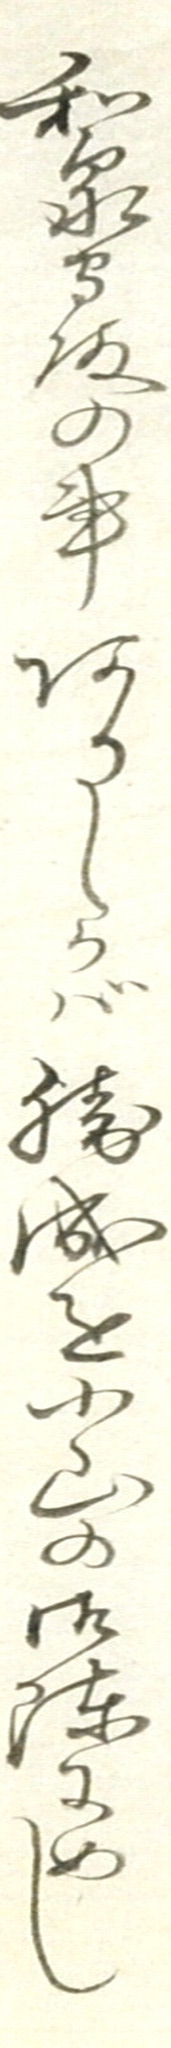和泉守殿の事ありしかば勝成を小山の御陣にめし
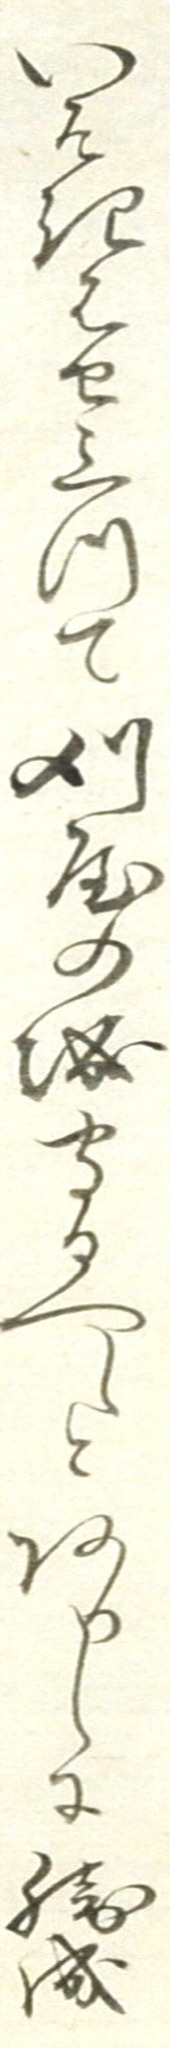いそきはせ上つて刈屋の城守へしとありしに勝成
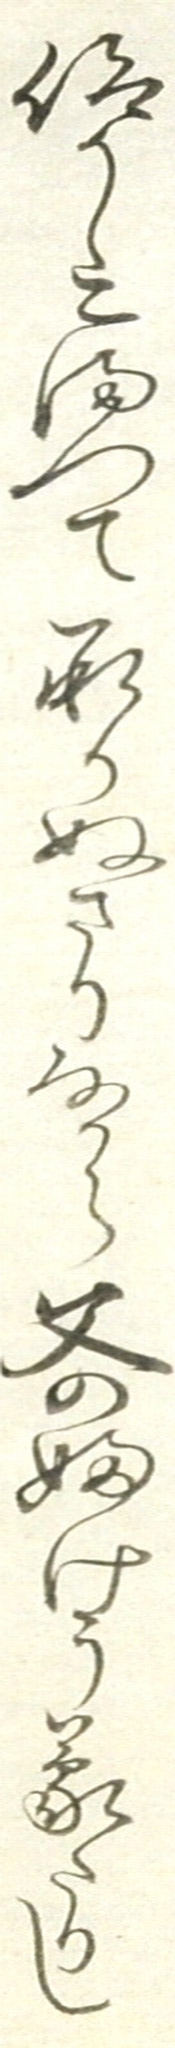仰かしこまつて承りぬさりなから父のふけう蒙たりし
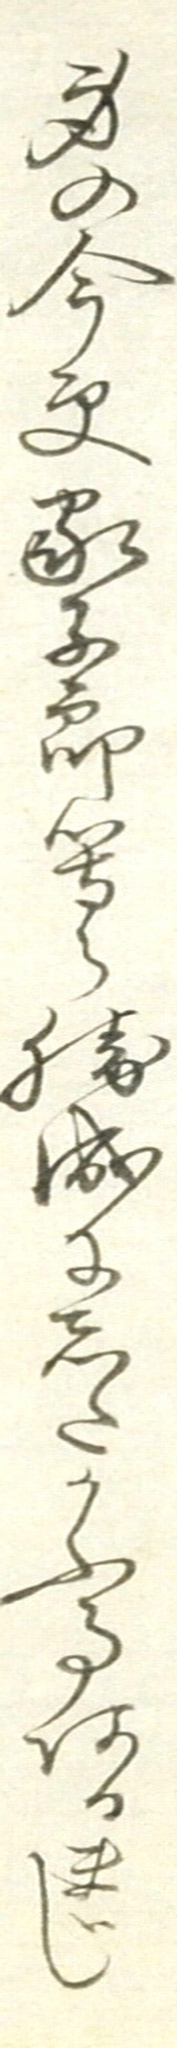身の今更家子郎等ら勝成にしたかふ事あるまじ
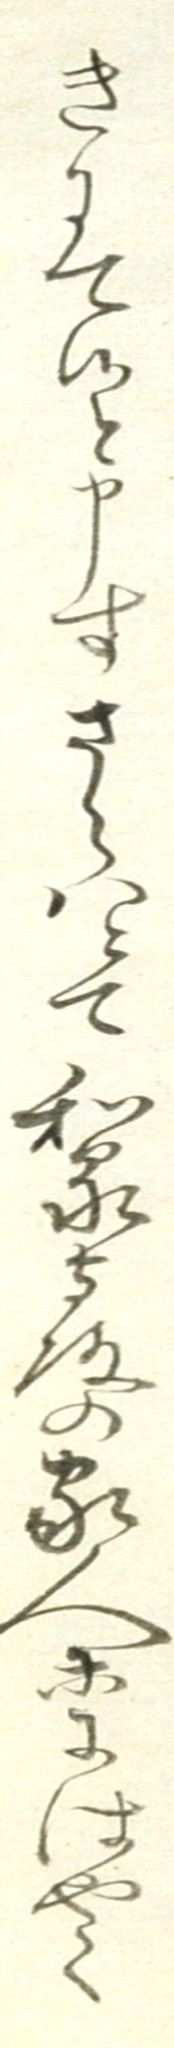きにて候と申すさらはとて和泉守殿の家人等にはやく
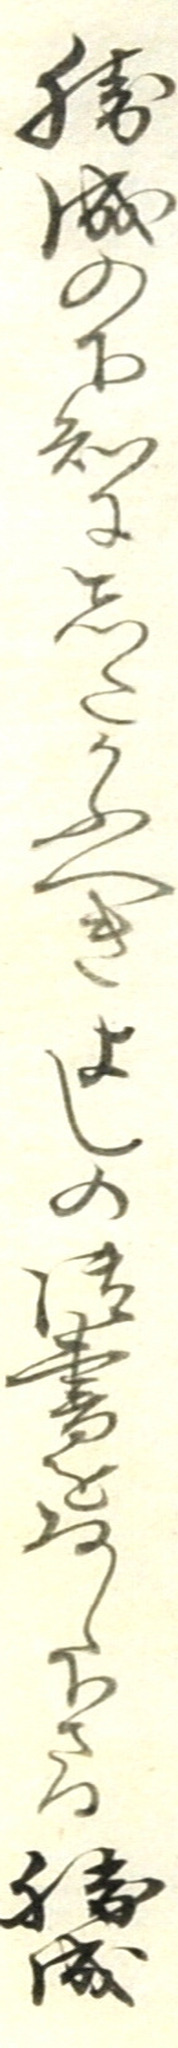勝成の下知にしたかふへきよしの御書をなし下さる勝成

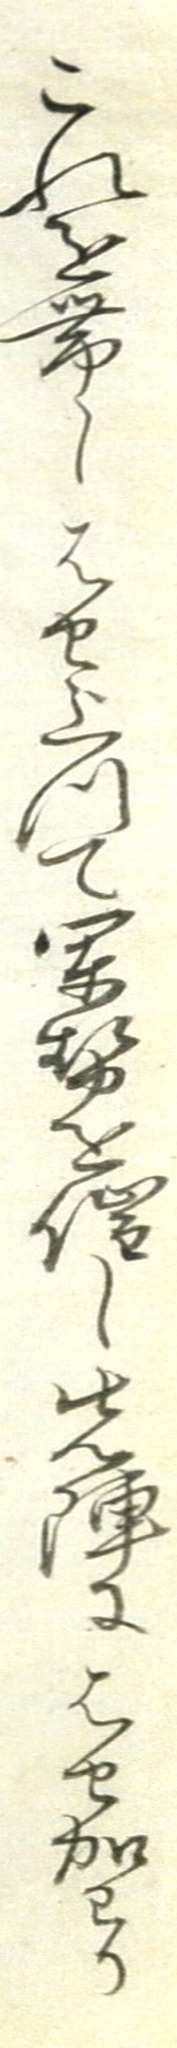これを帯しはせ上つて軍勢を催し先陣にはせ加わり
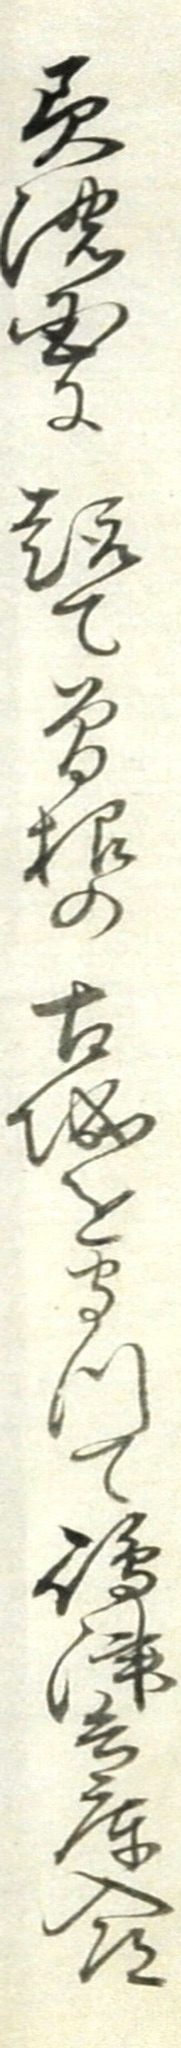美濃国に趣て曾根の古城を守つて島津兵庫入道
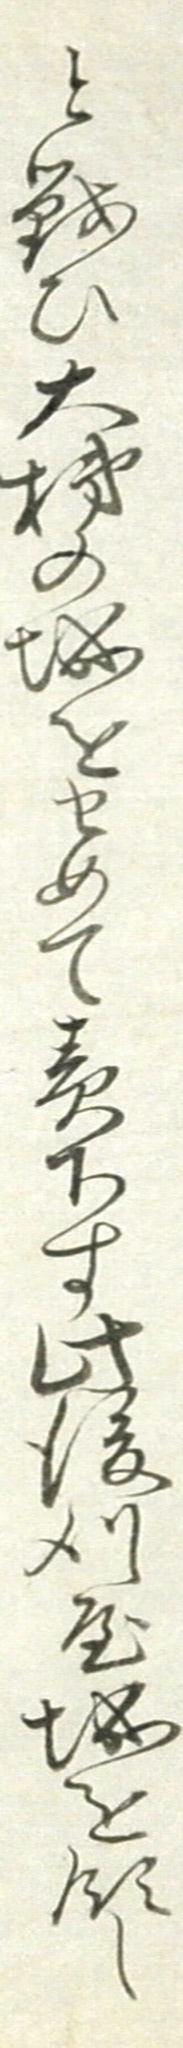と戦ひ大柿の城をせめて責下す此後刈屋城を領し
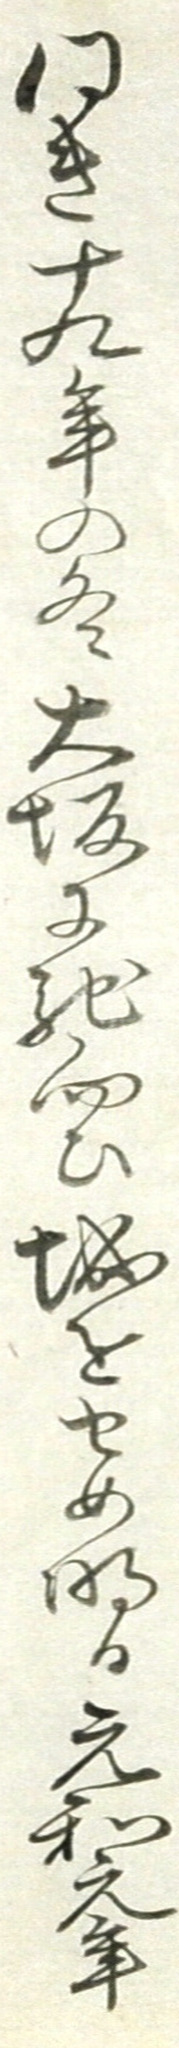同き十九年の冬大坂に馳向ひ城をせめ明る元和元年
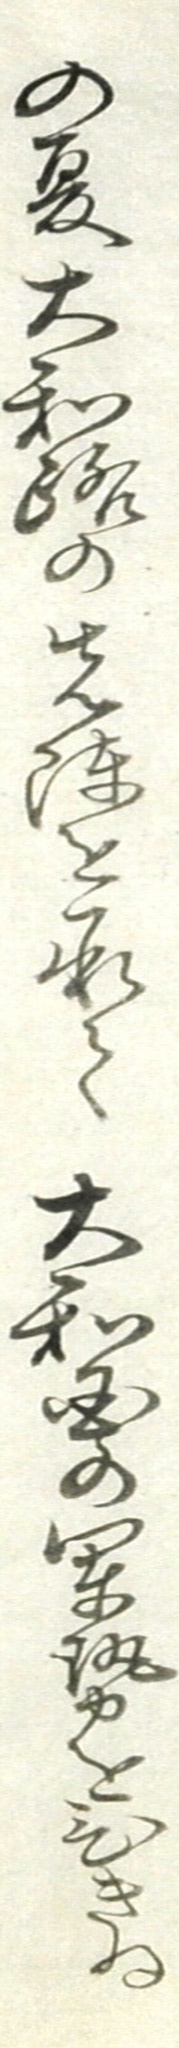の夏大和路の先陣を承て大和国の軍勢をひきゐ
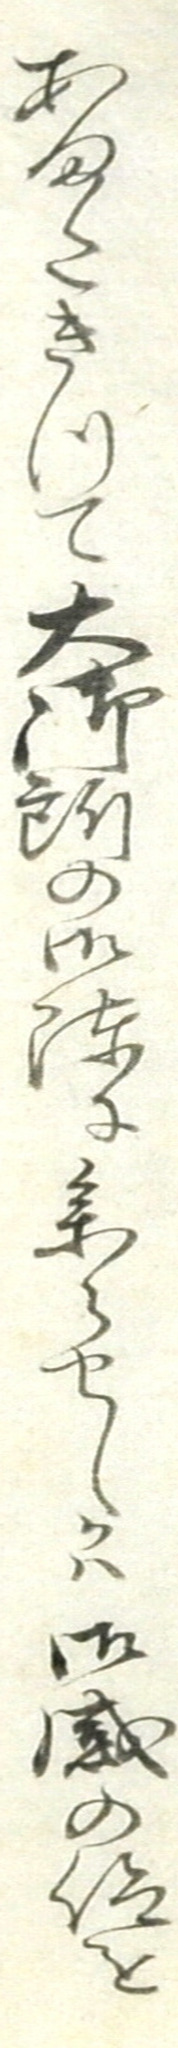あまたきつて大御所の御陣に参らせしかは御感の仰を
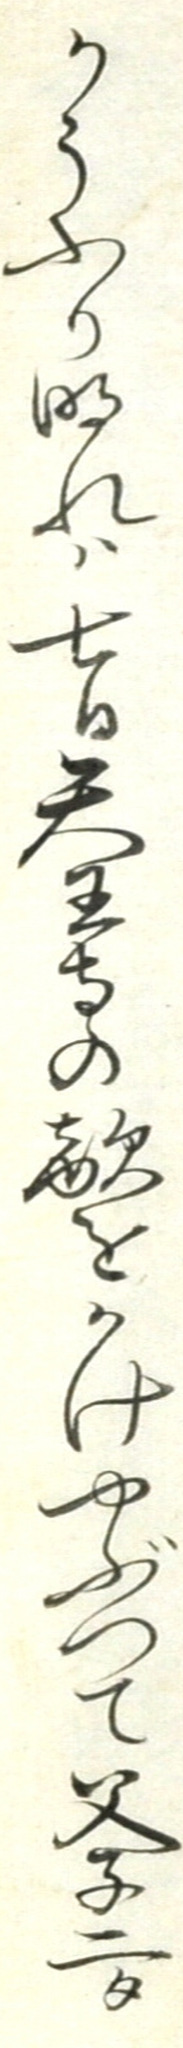かうふり明れは七日天王寺の敵をかけやぶつて父子二タ
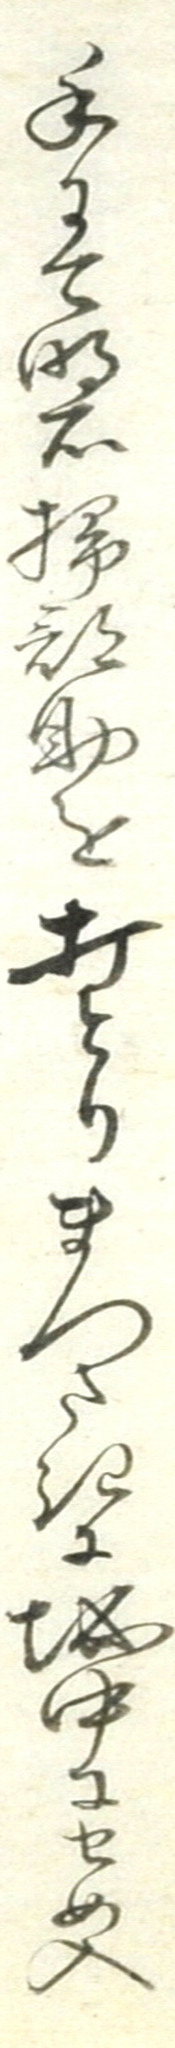手にて明石掃部助を打とりまつさきに城中にせめ入
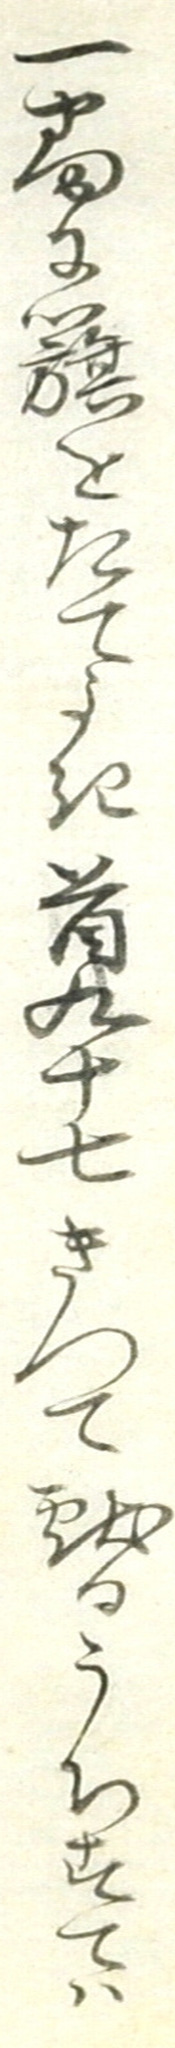一番に簱をたてよき首九十七きつて献るうちすては
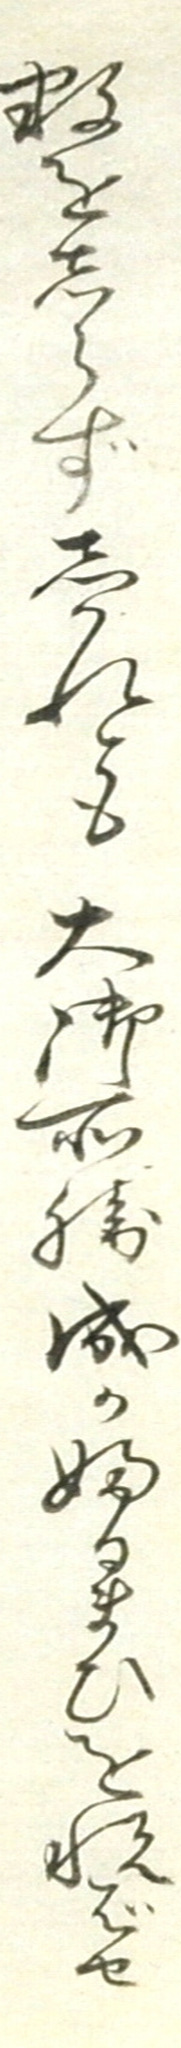数をしらずしかれとも大御所勝成かふるまひを悦ばせ
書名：藩翰譜（二・三）
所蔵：伊那市立高遠町図書館・合同会社AMANE
